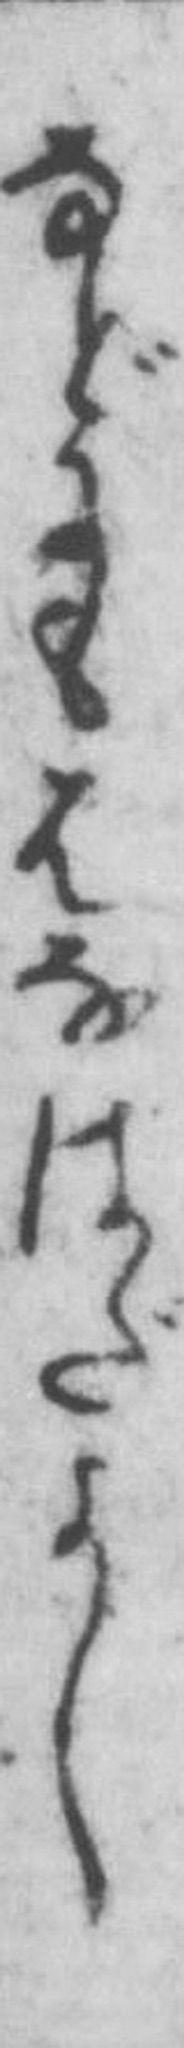などにもはなはだよし
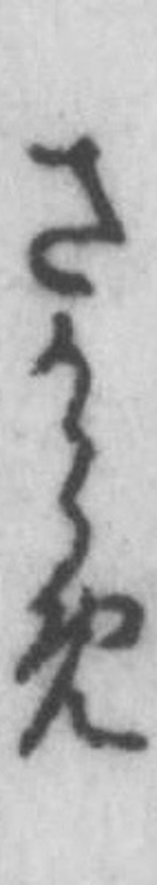さからめ
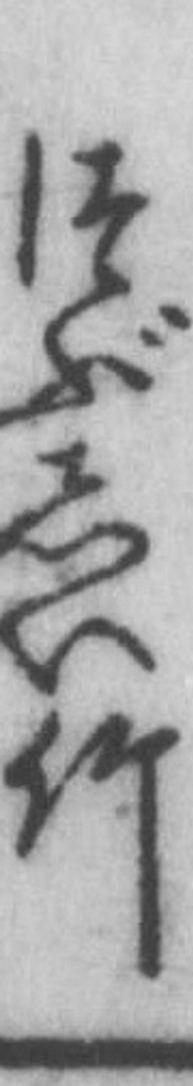つぶしい竹
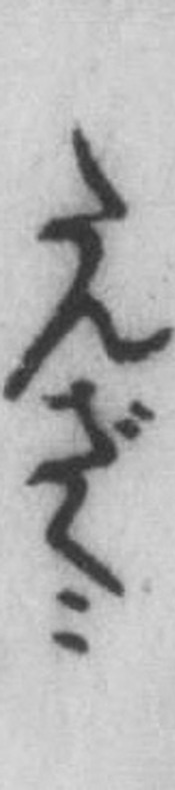たんざく
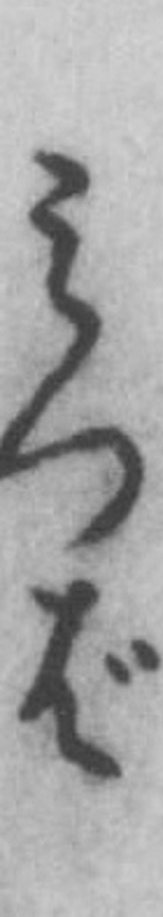ミつば
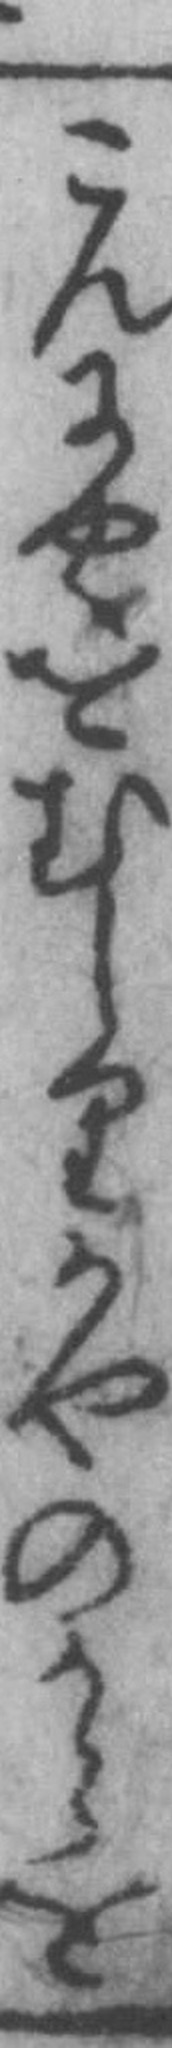こんにやくをむしえいかやのうらを
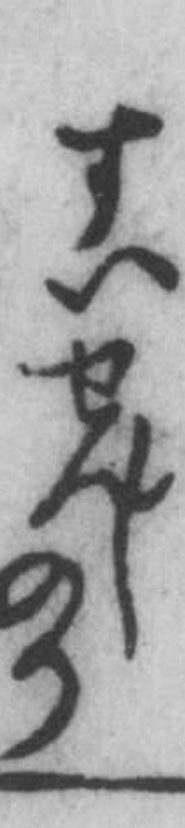すいせんしもどき
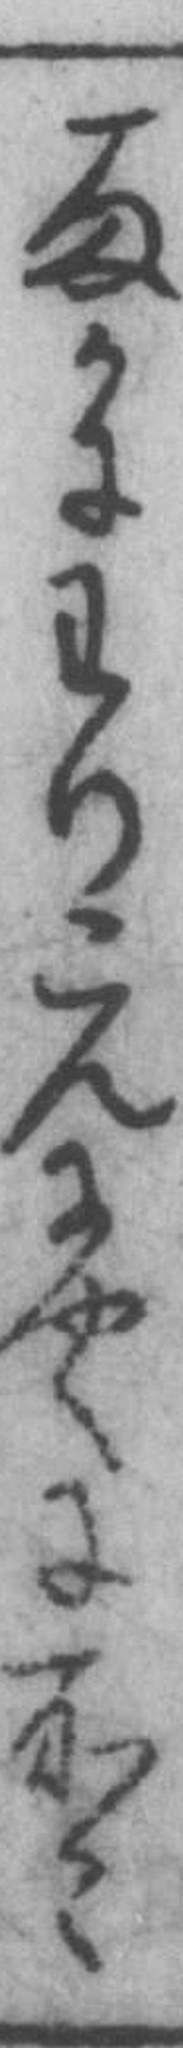かにわりこんにやくに所々
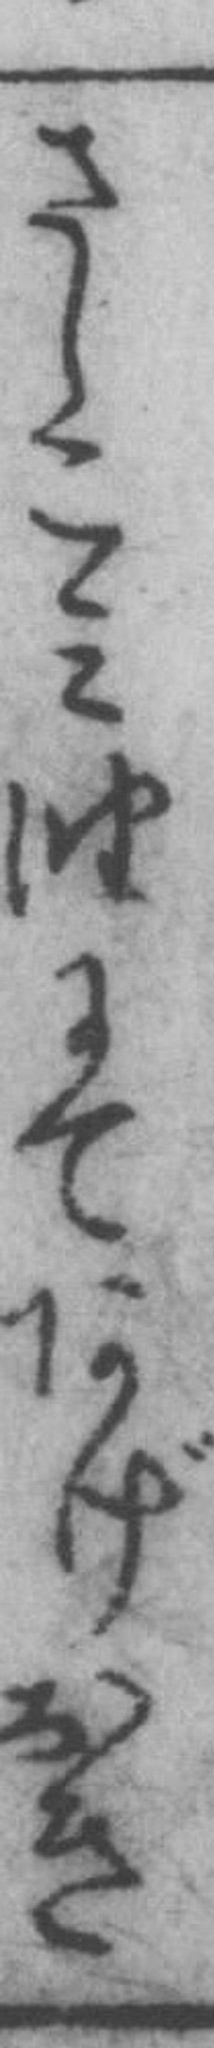さしこミ油にてあげおき
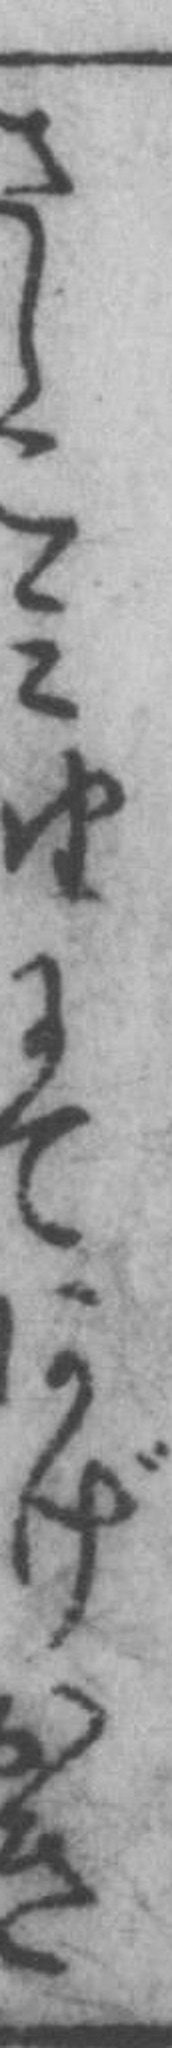さしこミ油にてあげおき
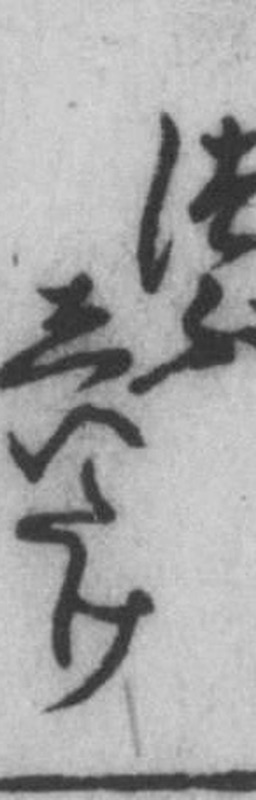しいたけ
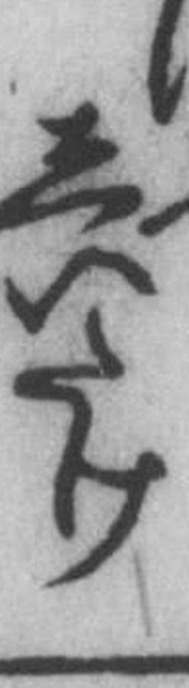しいたけ
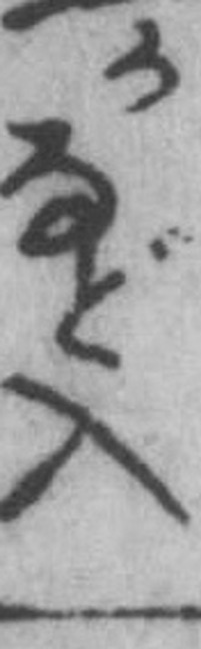など入
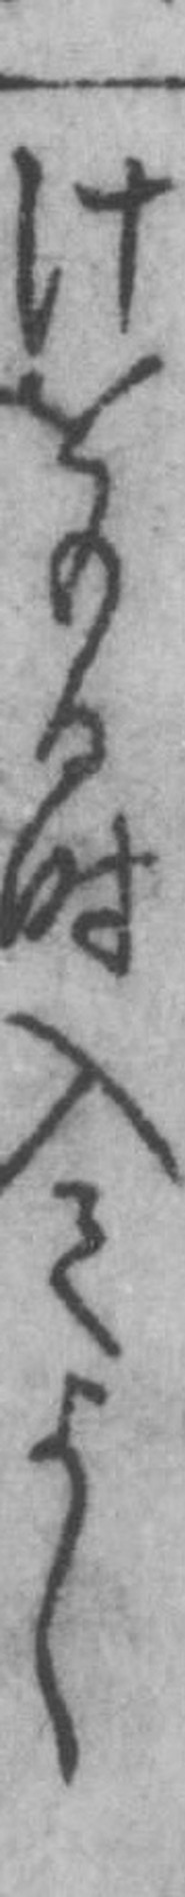汁をもる時入てよし
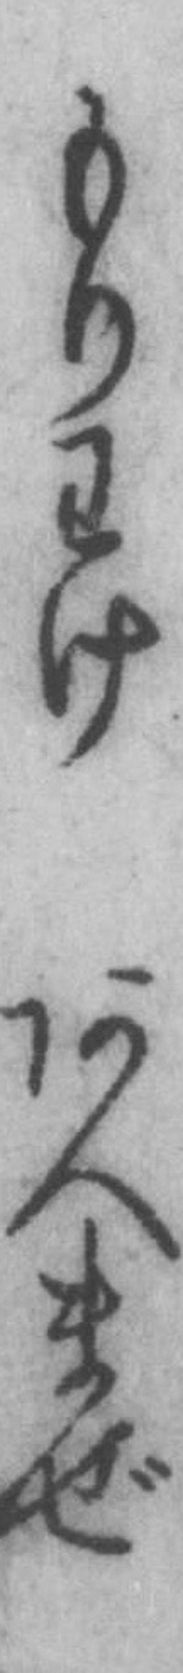もりわけあへまぜ
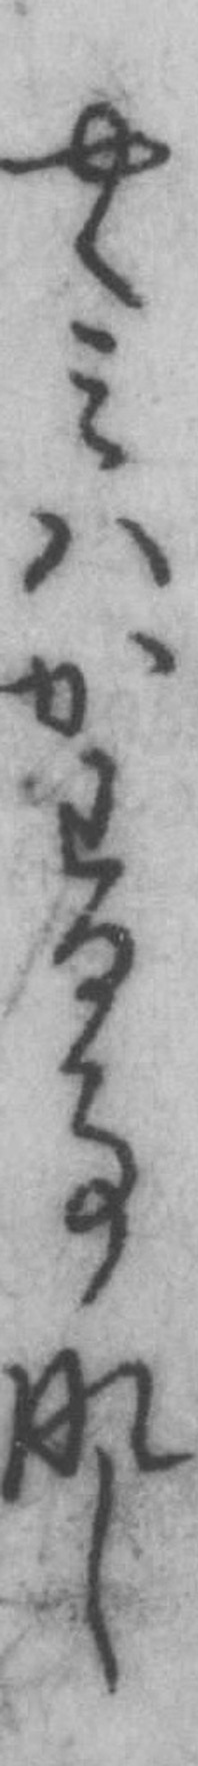やゝミハかわるるなし
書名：料理献立抄
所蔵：大阪府立大学学術情報センター 国文学研究資料館
